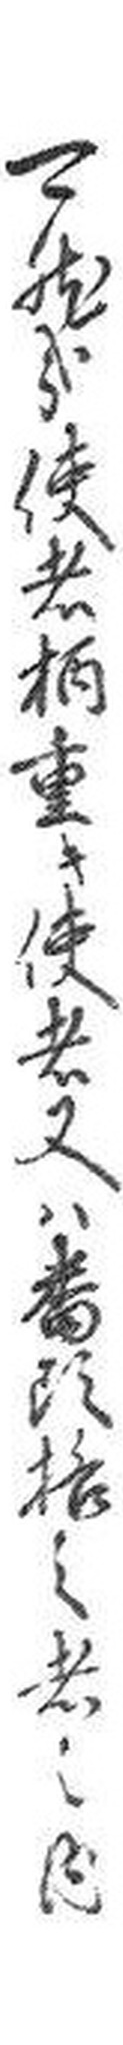可然哉使者柄重キ使者又ハ番頭格之者之内
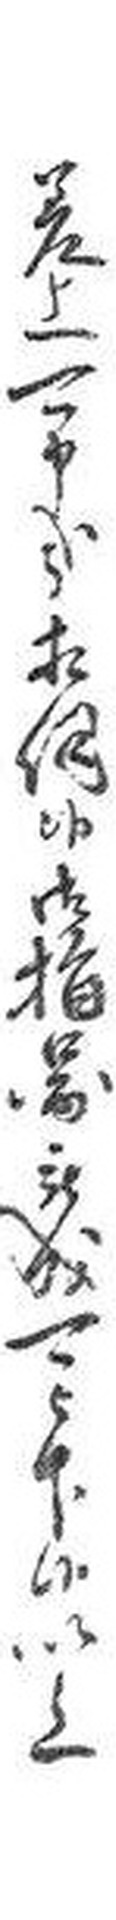差上可申哉相伺候御指図被成可被下候以上
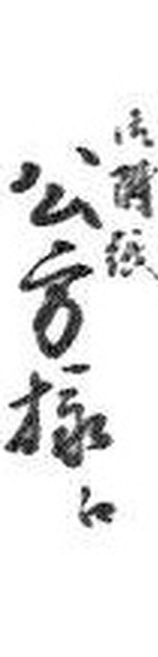公方様江
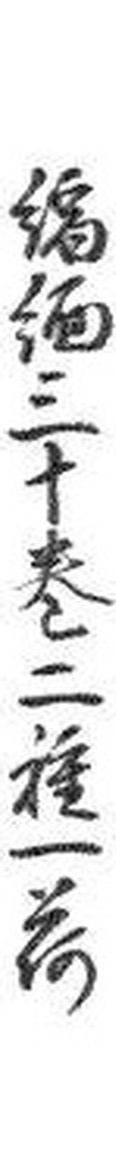縮緬三十巻二種一荷
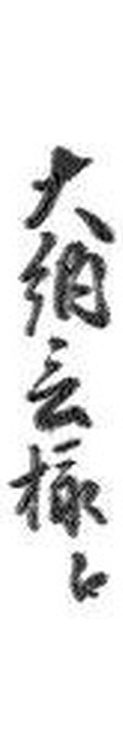大納言様江
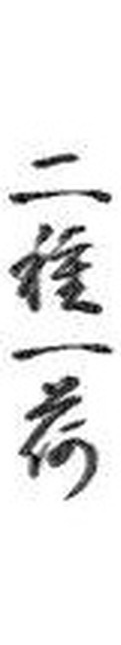二種一荷
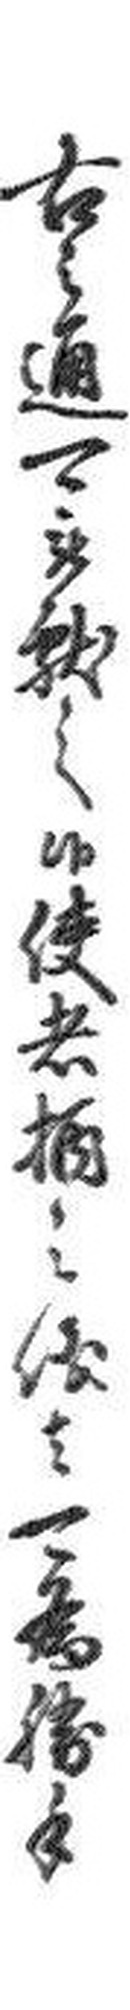右之通可被献之候使者柄之儀者可為勝手
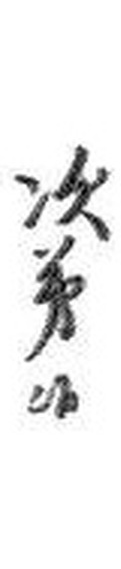次第候
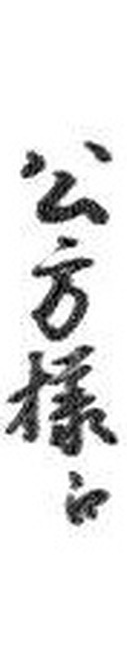公方様江
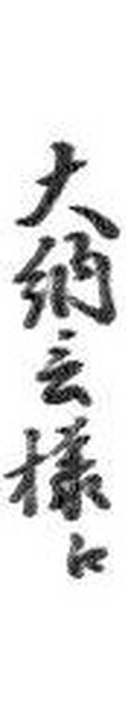大納言様江

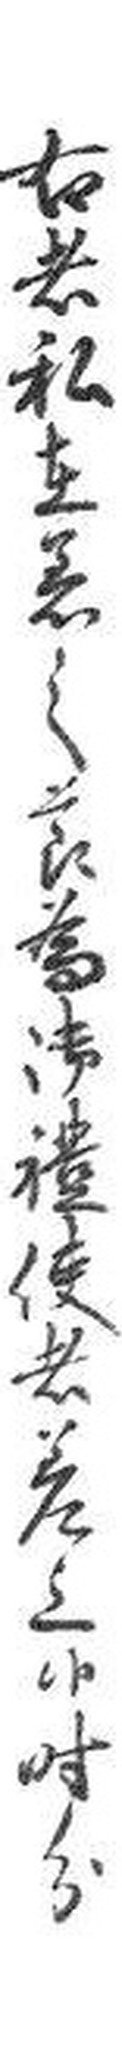右者私在着之節為御礼使者差上候時分
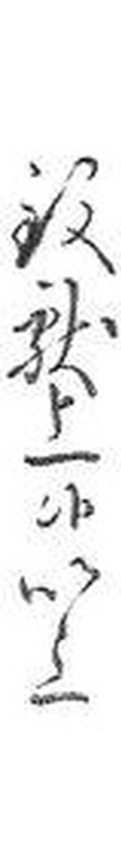致献上候以上
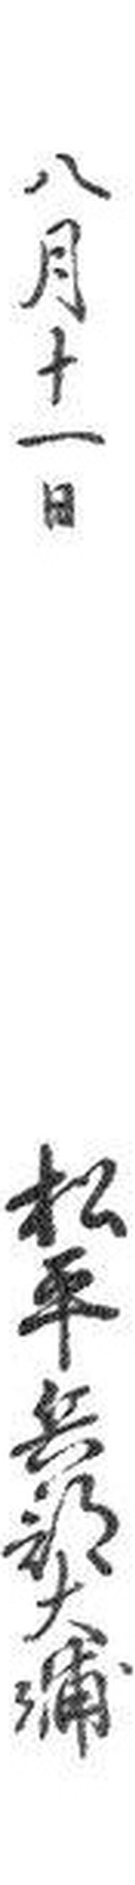八月十一日松平兵部大輔
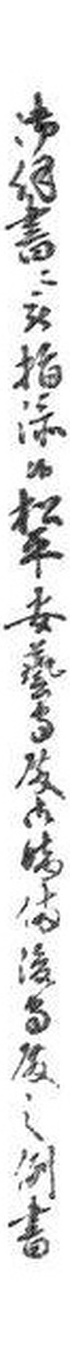御伺書ニ被指添候松平安芸守殿御嫡備後守殿之例書
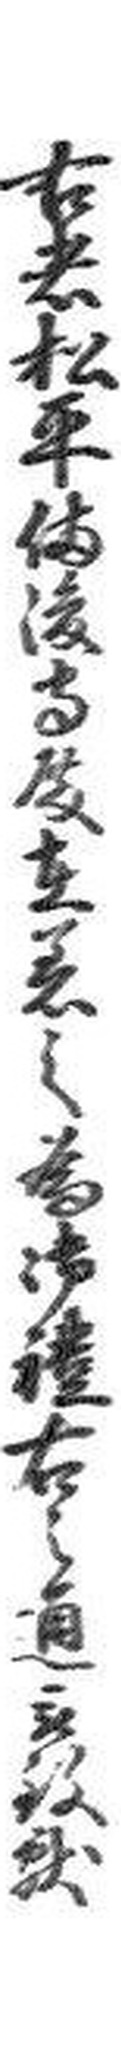右者松平備後守殿在着之為御礼右之通被致献
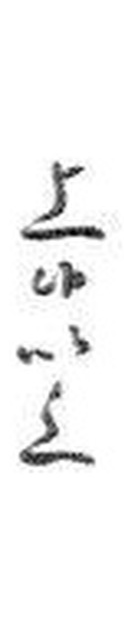上候以上
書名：家譜 二十四 吉品公 従宝永三年到同五年
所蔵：福井県文書館 Fukui Prefectural Archives
